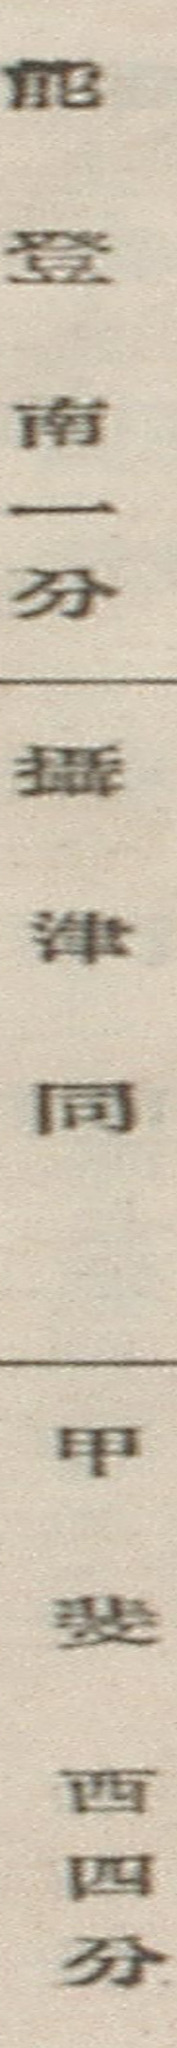能登南一分摂津同甲斐西四分
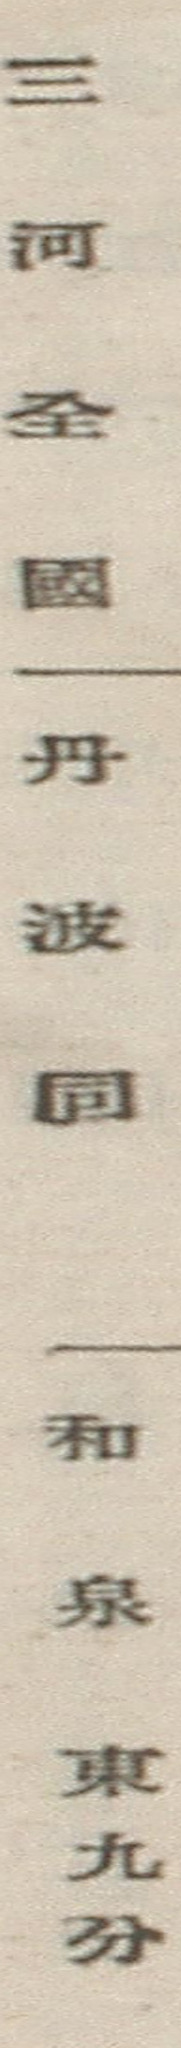三河全國丹波同和泉東九分

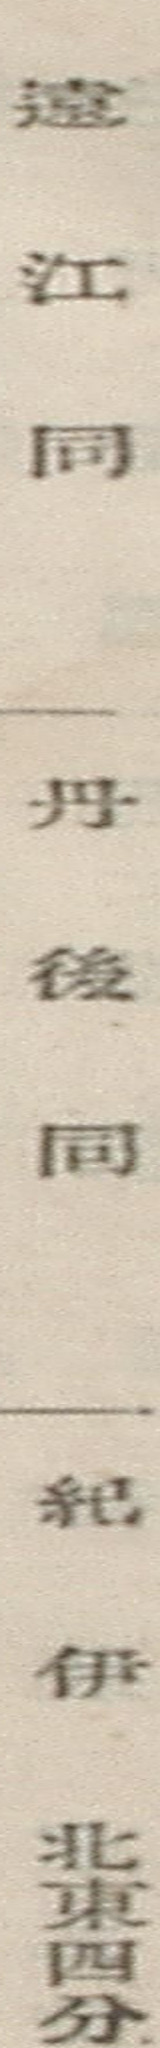遠江同丹後同紀伊北東四分
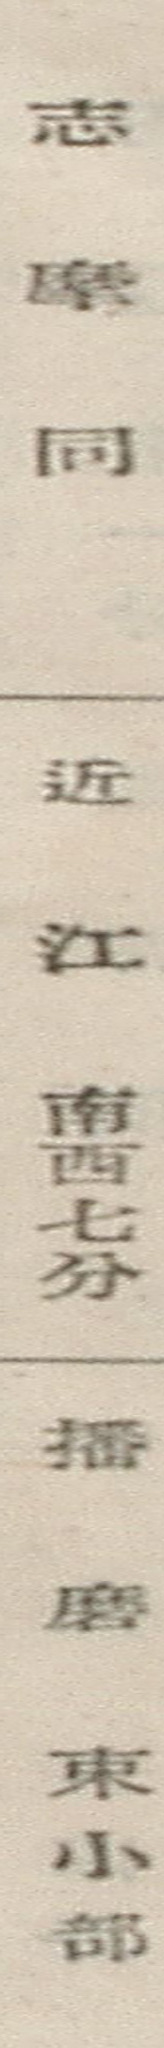志摩同近江南西七分播磨東小部
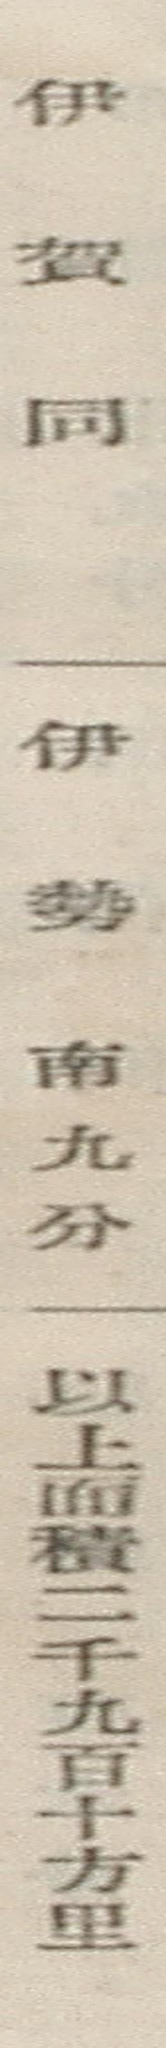伊賀同伊勢南九分以上面積二千九百十方里
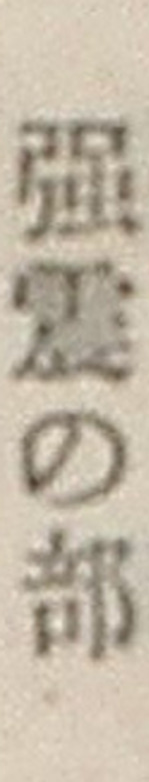強震の部
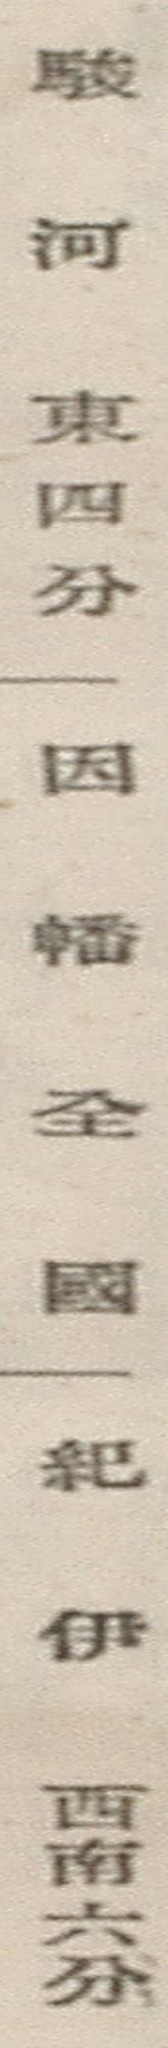駿河東四分因幡全国紀伊西南六分
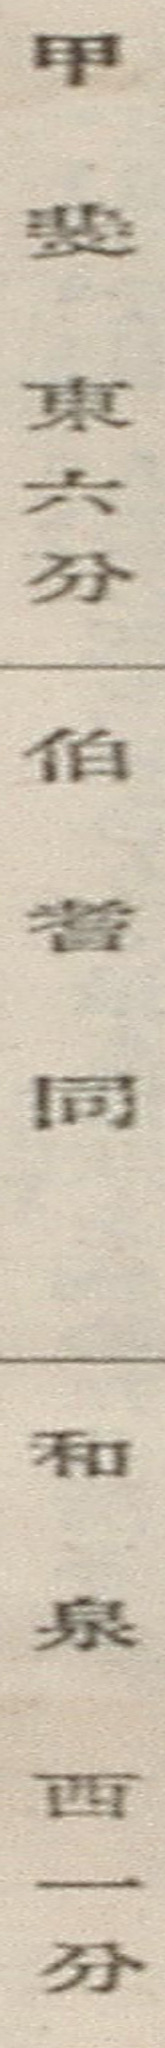甲斐東六分伯耆同和泉西一分
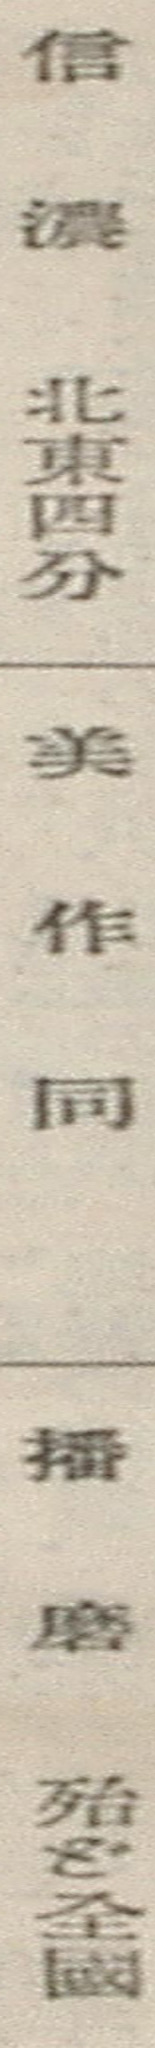信濃北東四分美作同播磨殆ど全国
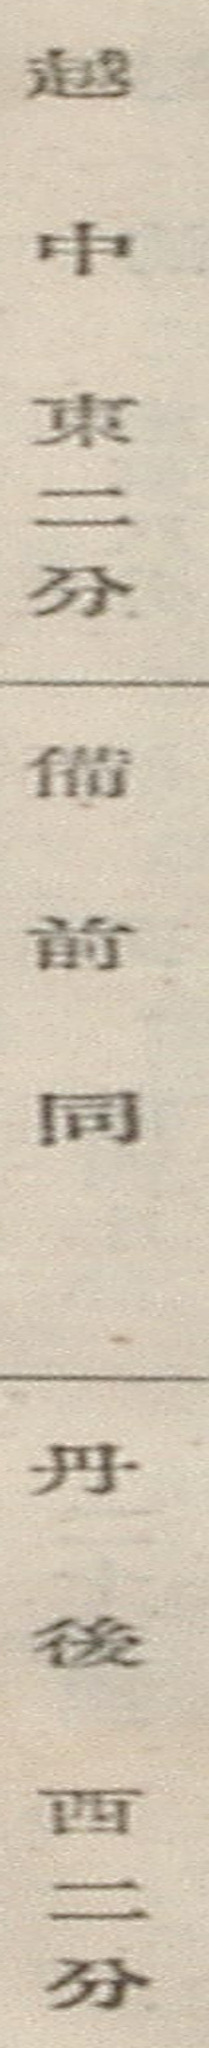越中東二分備前同丹後西二分
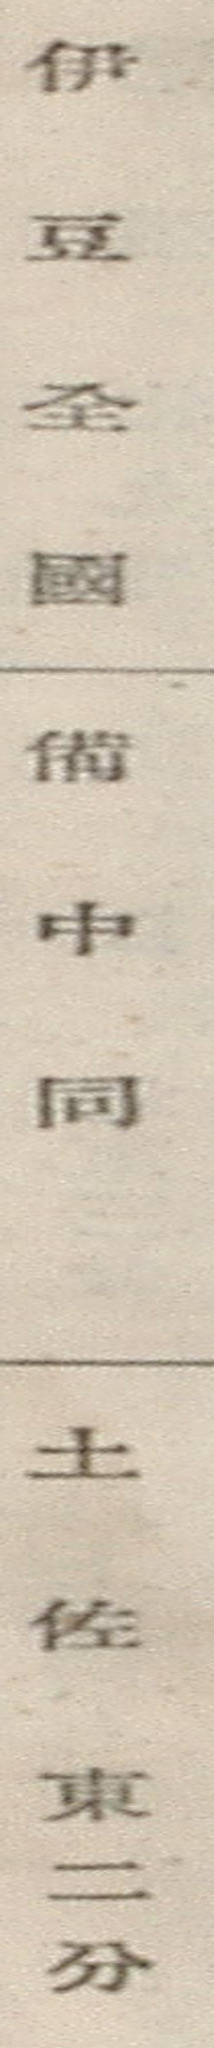伊豆全国備中同土佐東二分
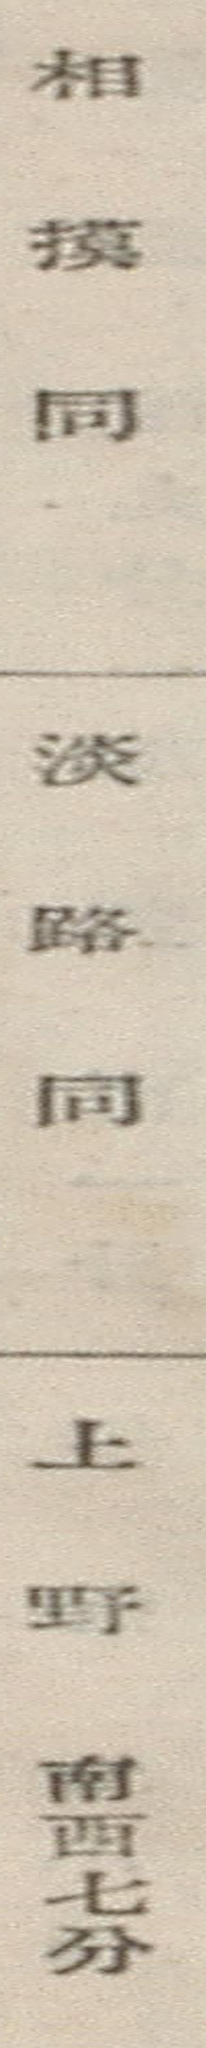相模同淡路同上野南西七分
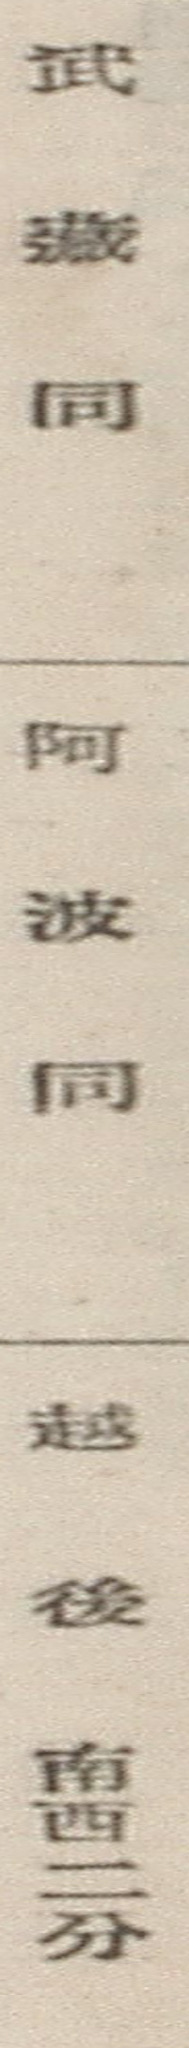武蔵同阿波同越後南西二分
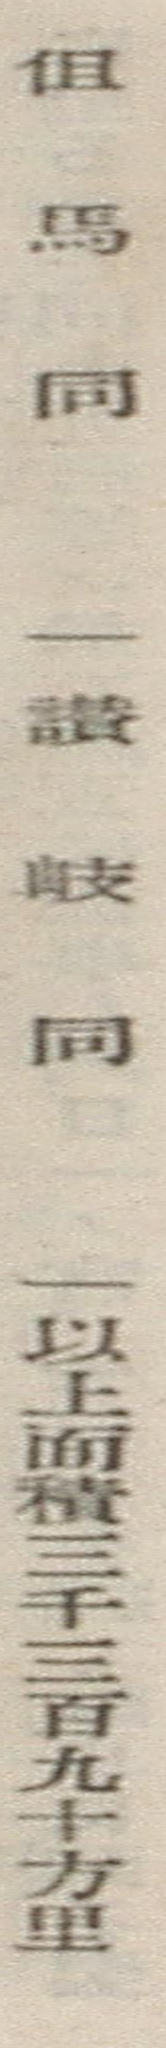但馬同讃岐同以上面積三千三百九十方里
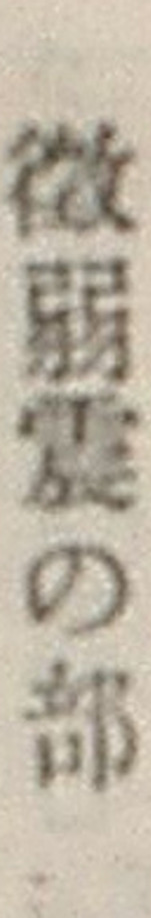微弱震の部
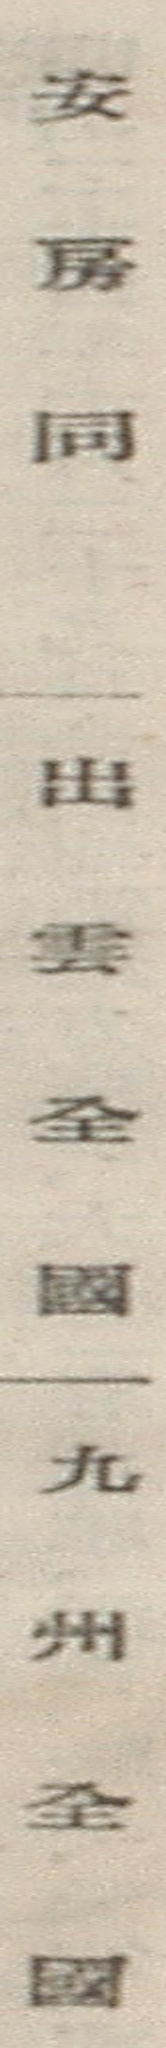安房同出雲全国九州全国
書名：愛知岐阜福井三県　大地震見聞録（内題）
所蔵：東京大学地震研究所図書室 Earthquake Research Institute Library, The University of Tokyo, JAPAN
